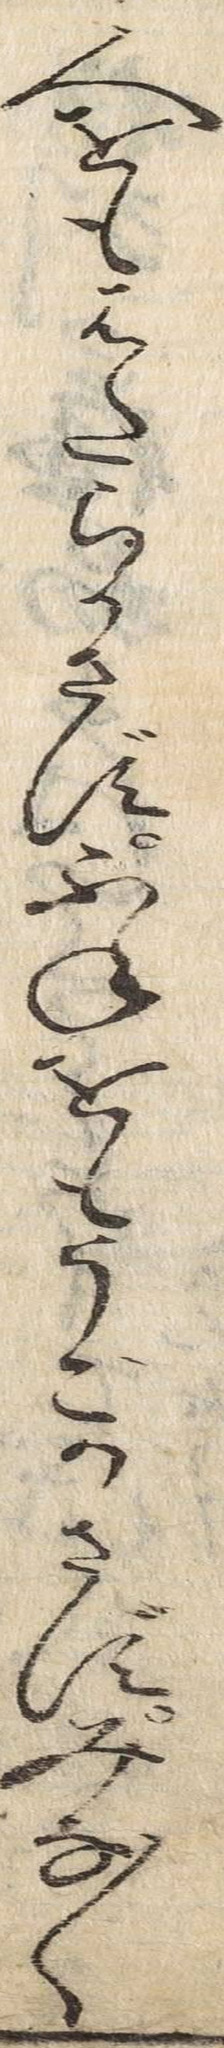人をもはたらかさず。ふねをもうごかさず。みな〳〵
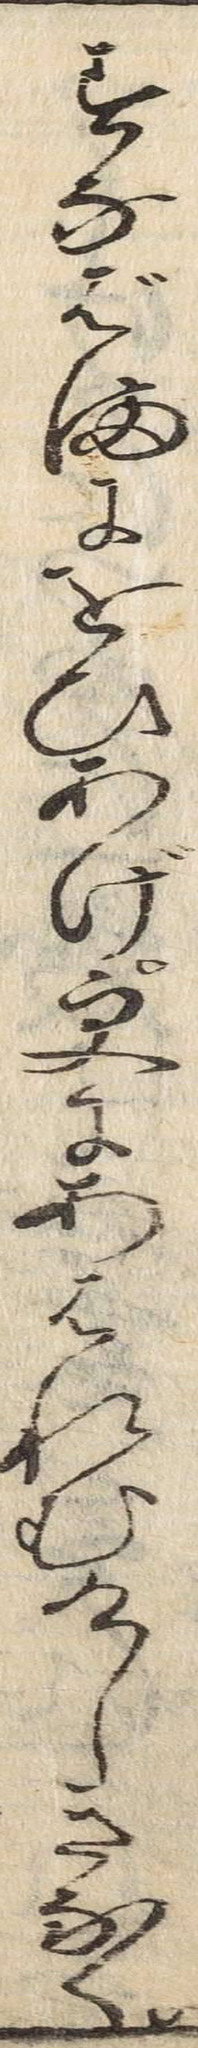すなばまにをひあげ。更にあはれむけしきなく。
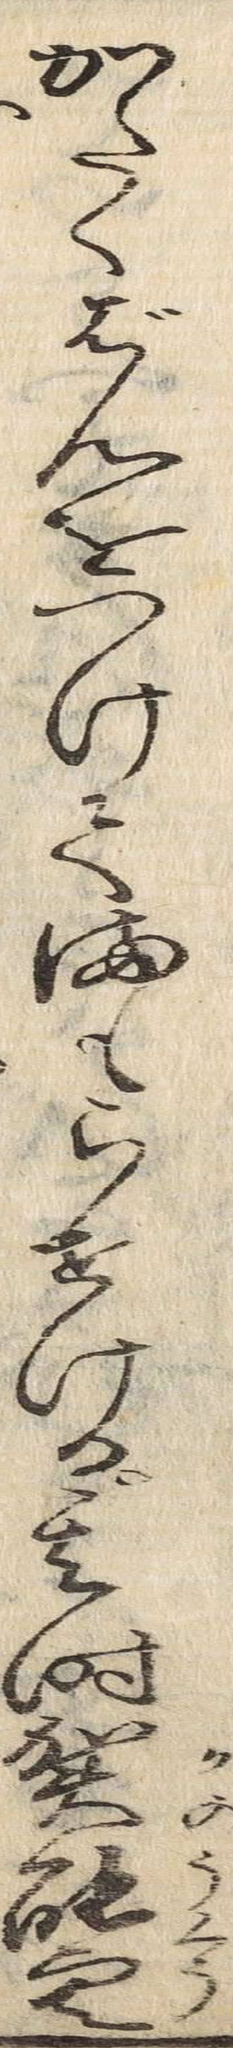かたくばんをつけてまもらせける。其時賀能空
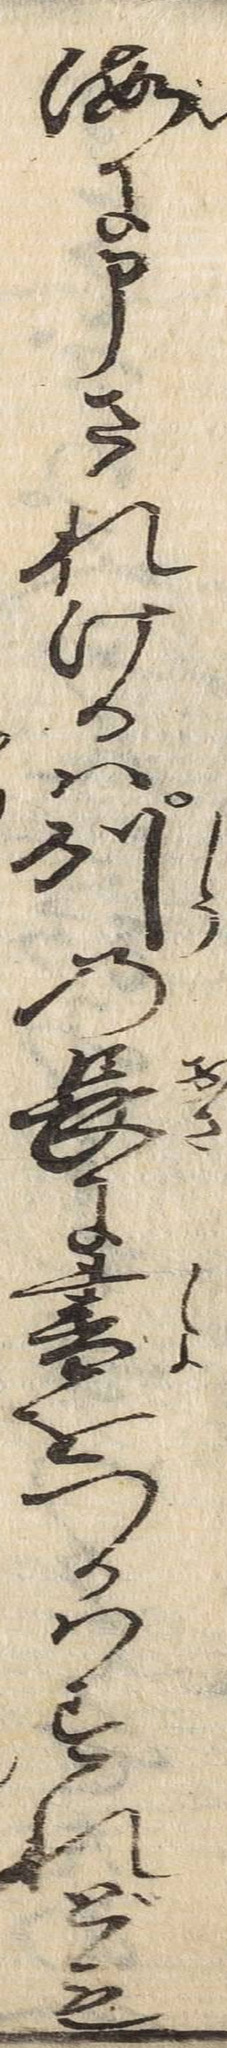海に申されけるは。州の長に書をつかはすれども
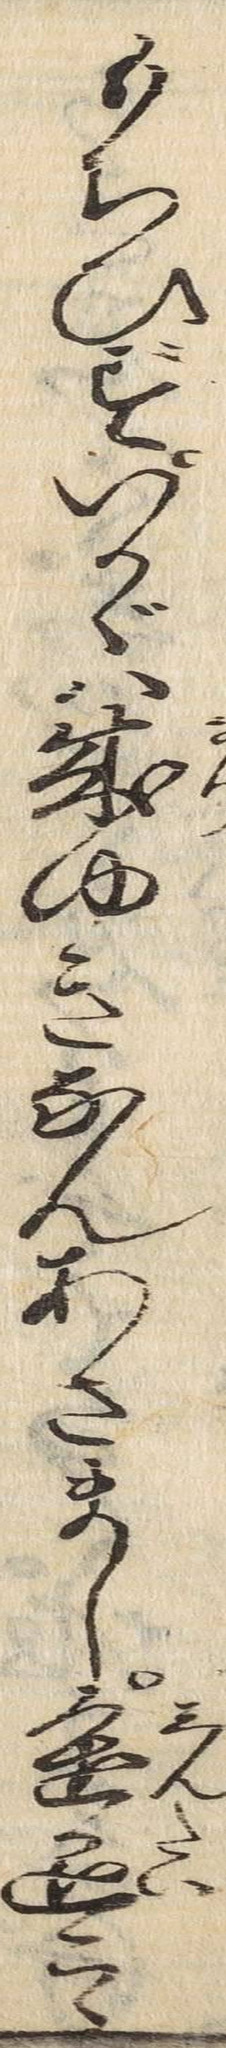もちひす。いかゞは成ゆきなんあさまし。進退こゝ
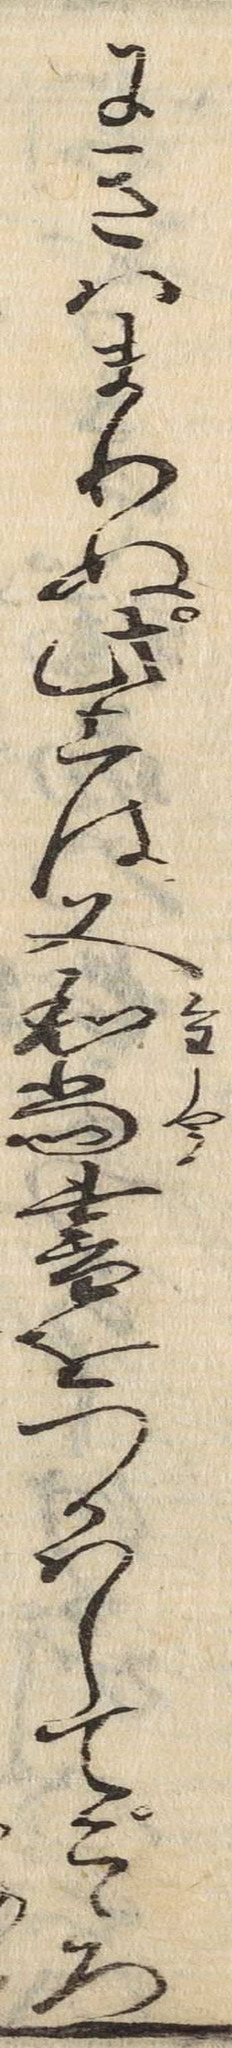にきはまりぬ。此上は又和尚書をつかはして。こゝろ
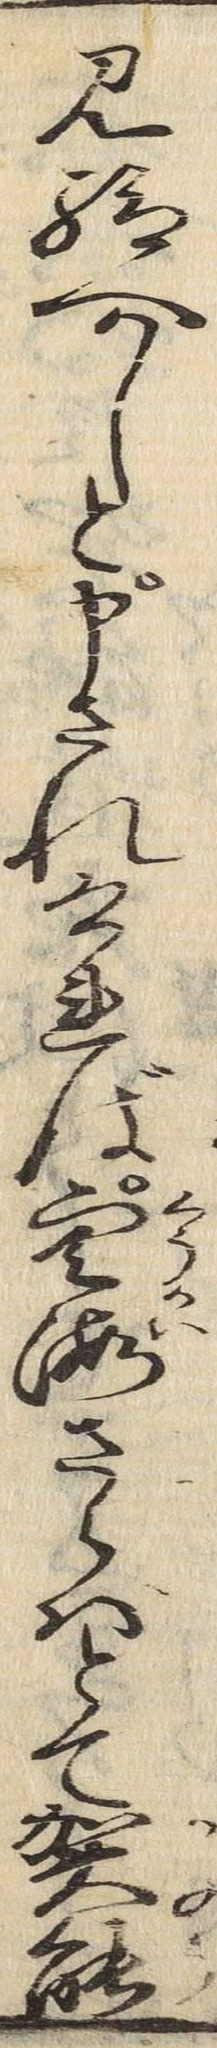み給へかしと。申されければ。空海さらはとて賀能
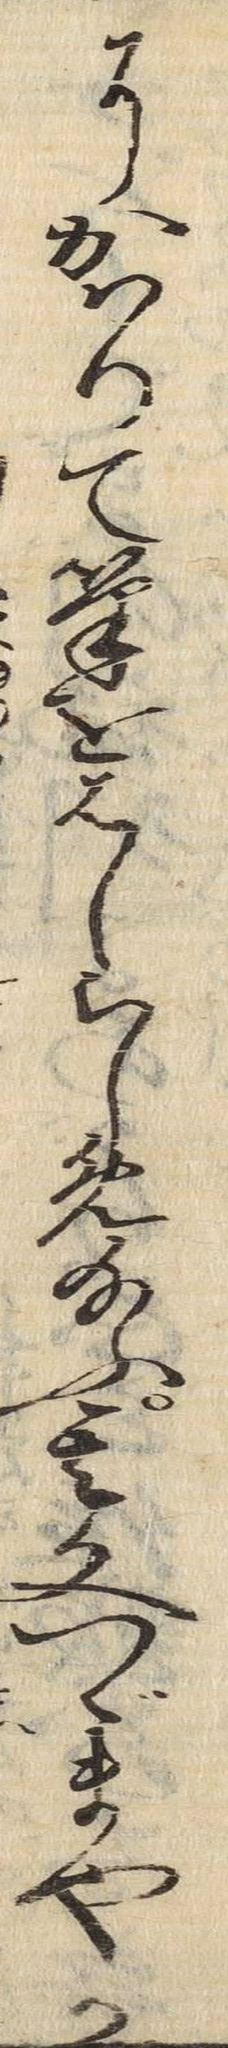にかはりて筆をはしらしめ給ふ。其文つゞまやか
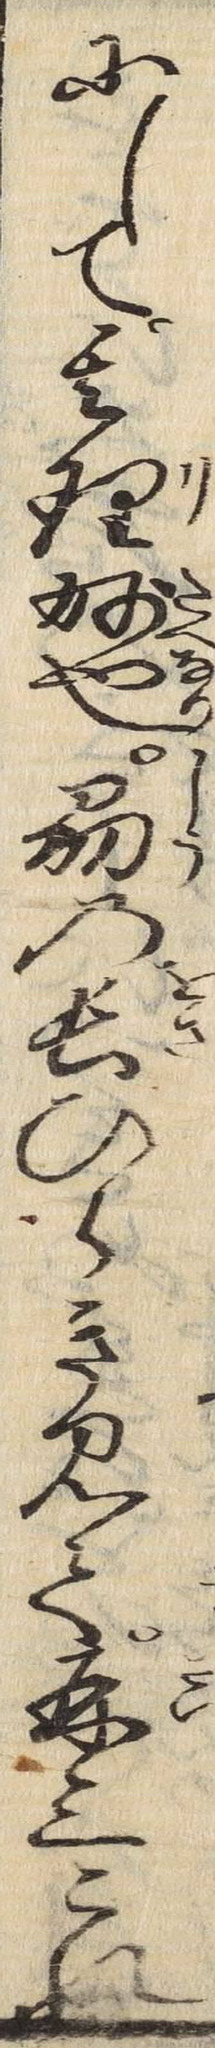にして。其理妙也。州の長ひらき見て。再三これ
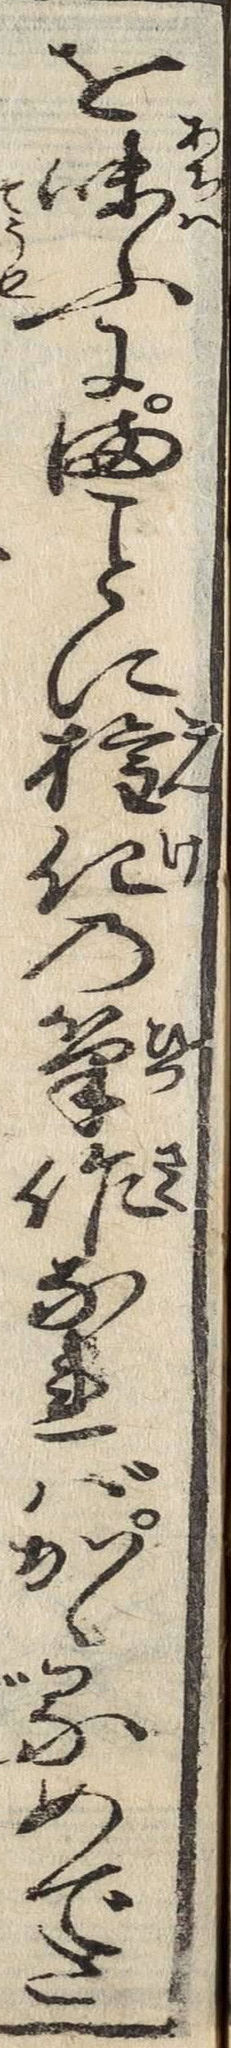を味ふに。まことに権化の筆作なれば。かゝるめでた
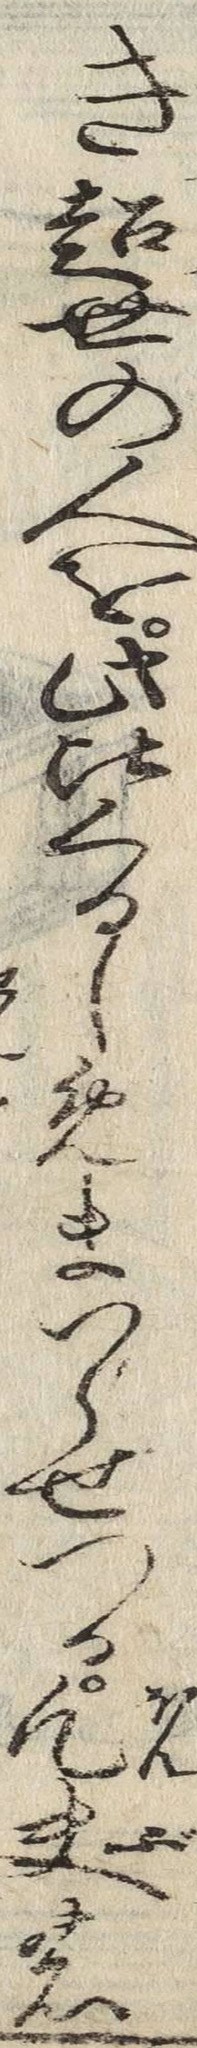き超世の人を。此頃くるしめまいらせつる。凡夫の
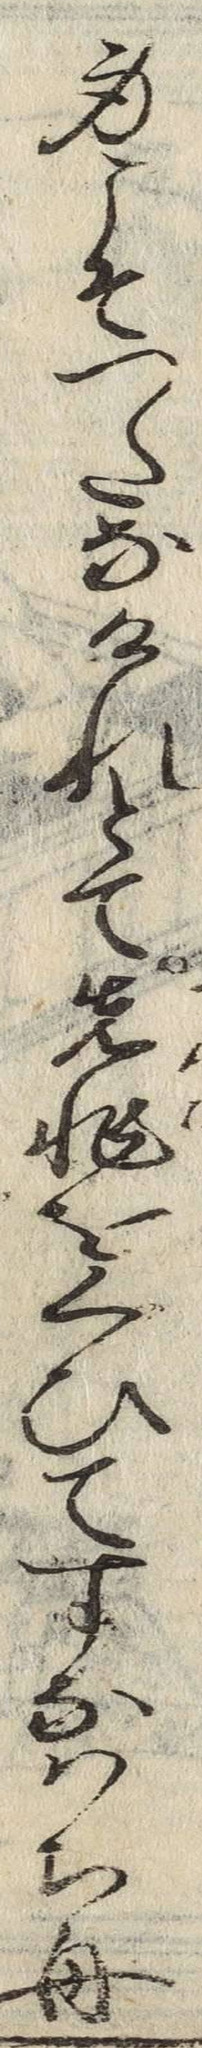身こそつたなけれとて。先非をくひてすなはち舟
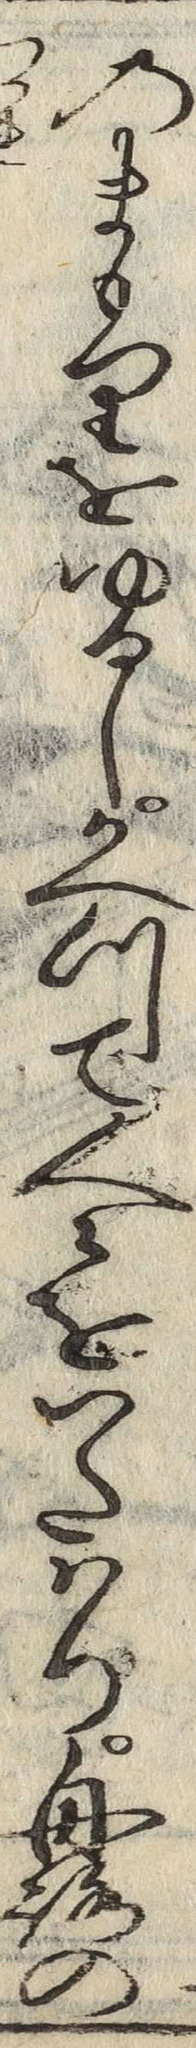のまもりをゆるし。かへつて人々をいたはり。舟路の
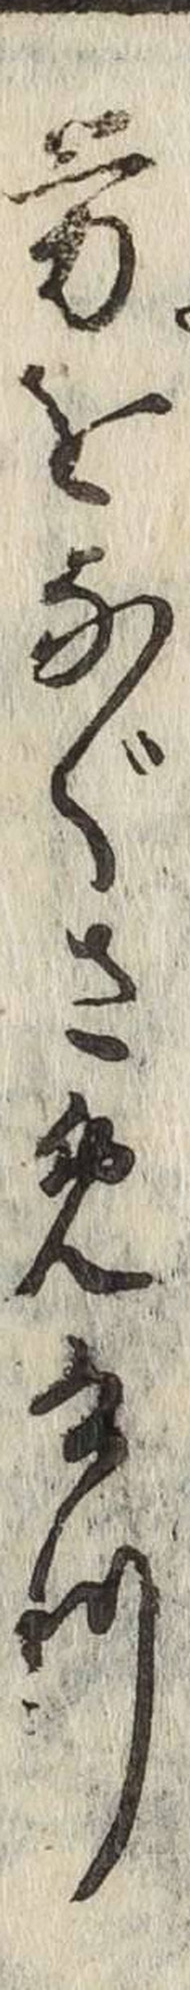労をなぐさめけり

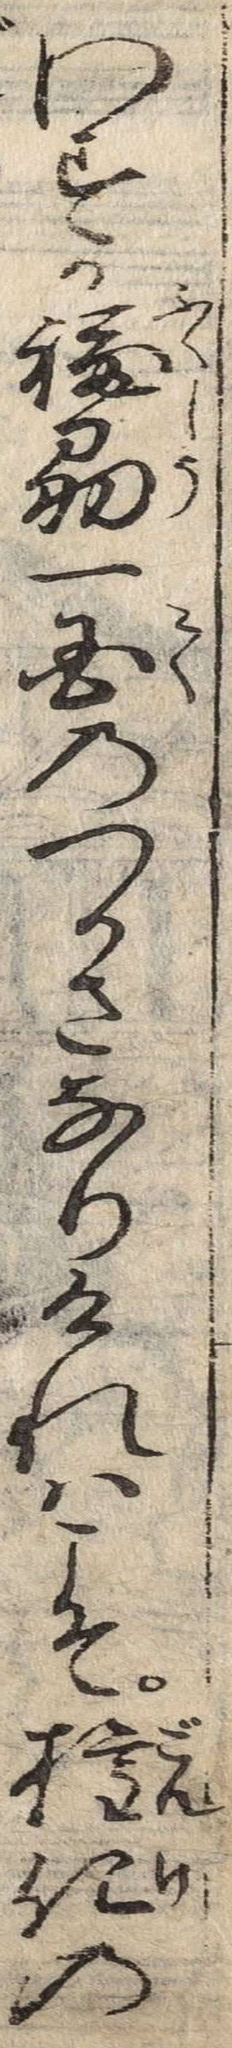わつか福州一国のつかさなりけれはこそ。権化の
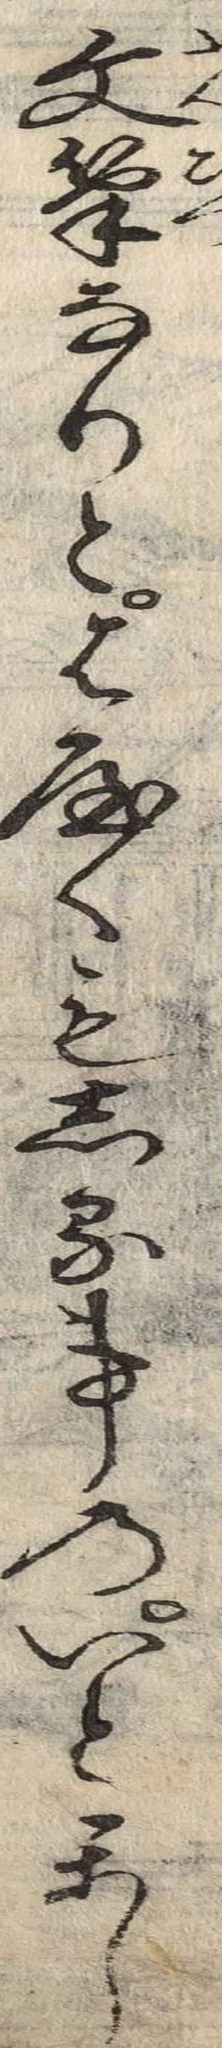文筆なりと。はやくもしる事の。いとかし
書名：弘法大師御傳記
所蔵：京都府立京都学・歴彩館 国文学研究資料館
